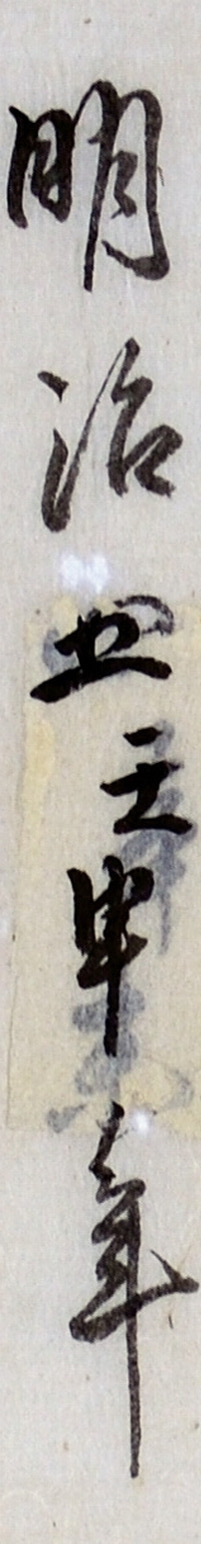明治五壬申年
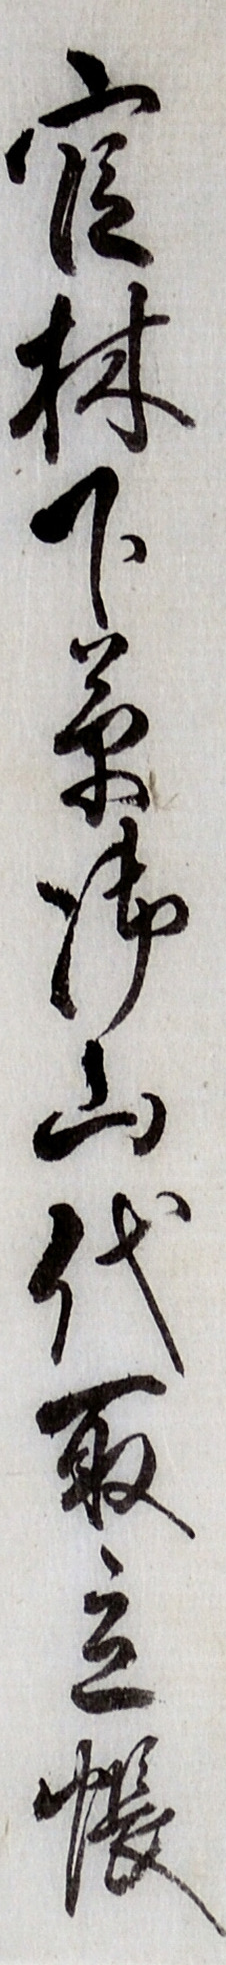官林下草御山代取立帳
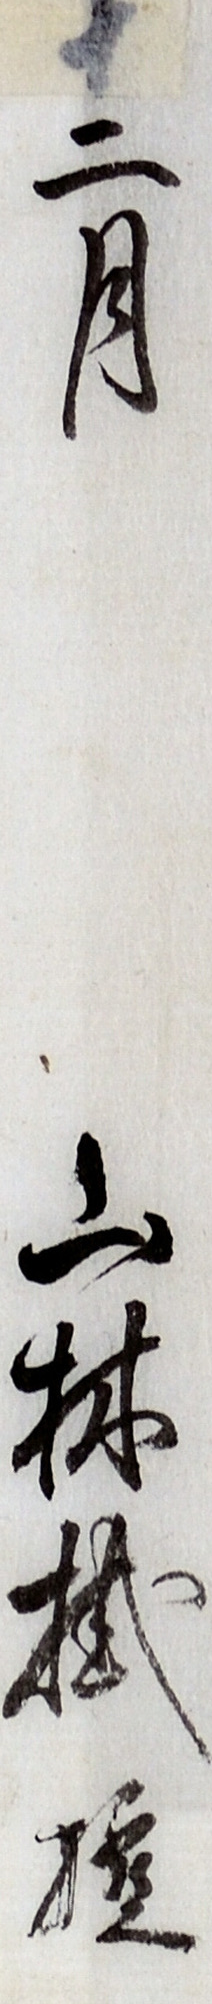十二月山林懸控

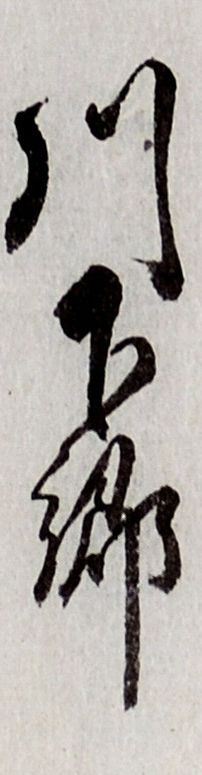川下郷
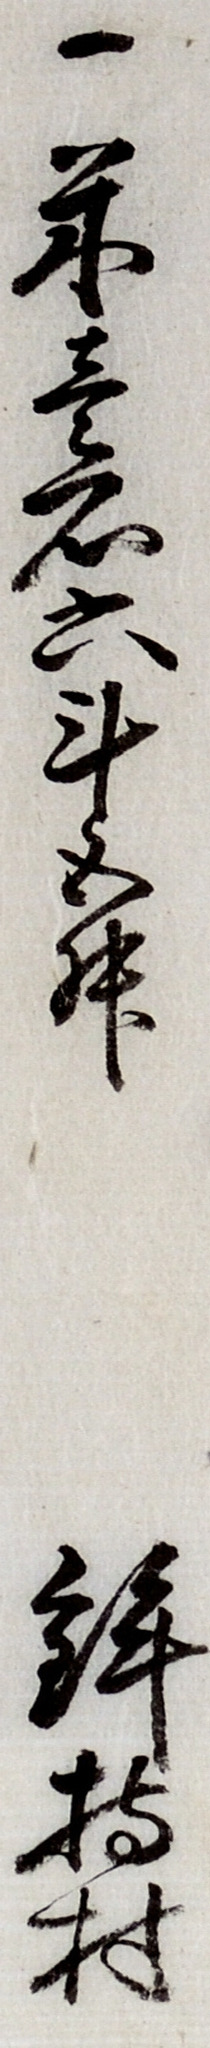一米壱石六斗五升鉾持村
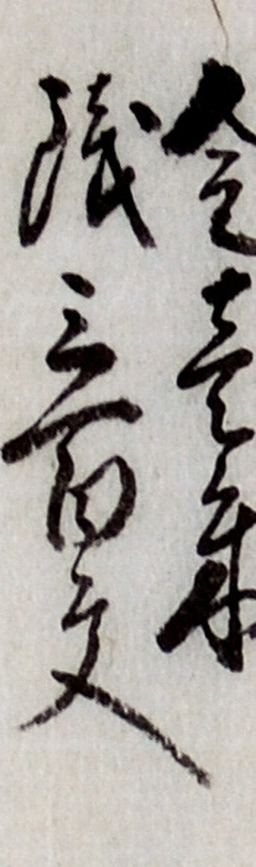銭三百文
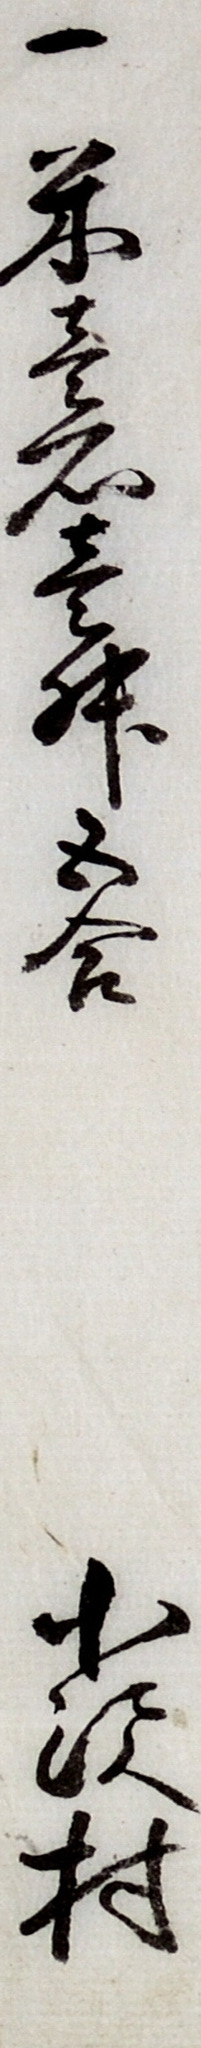一米壱石壱升五合小沢村

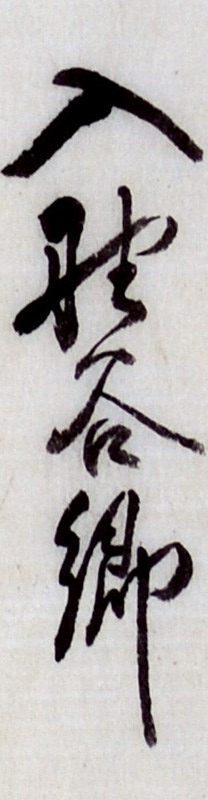入野谷郷
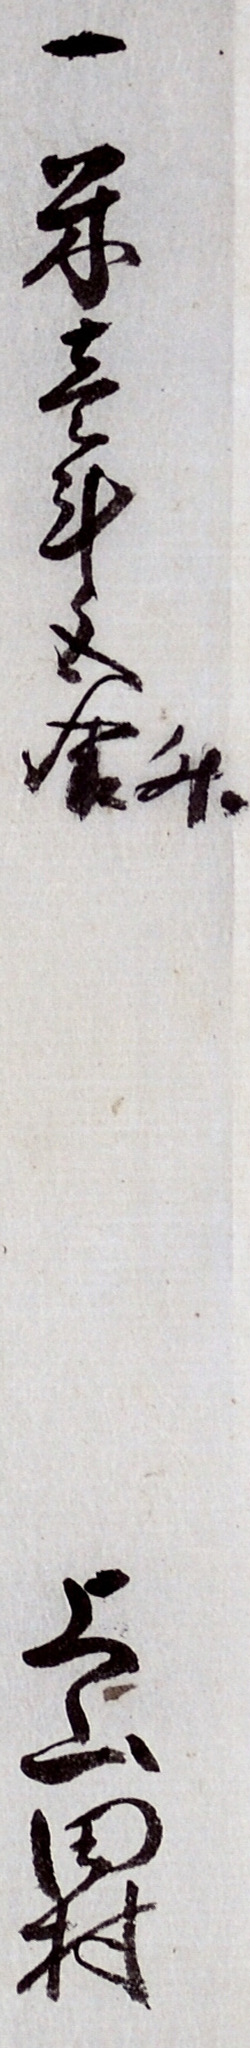一米壱斗五合上山田村
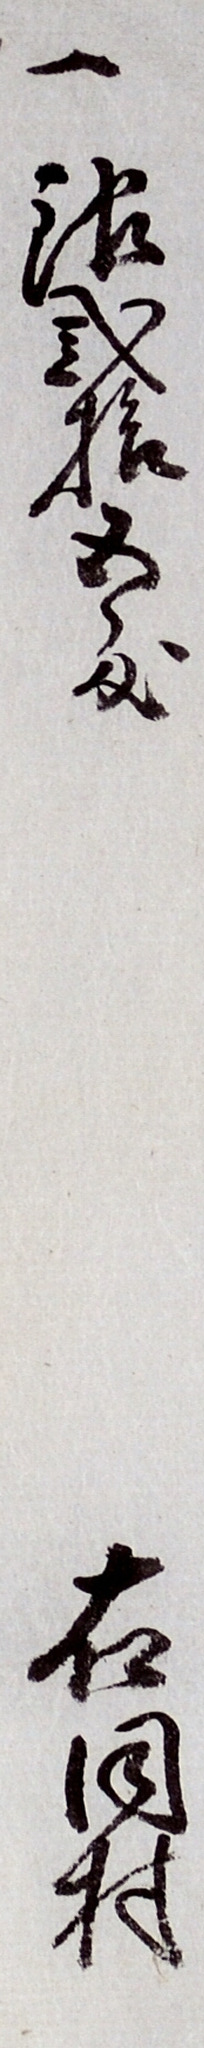一銀弐住拾五匁右同断
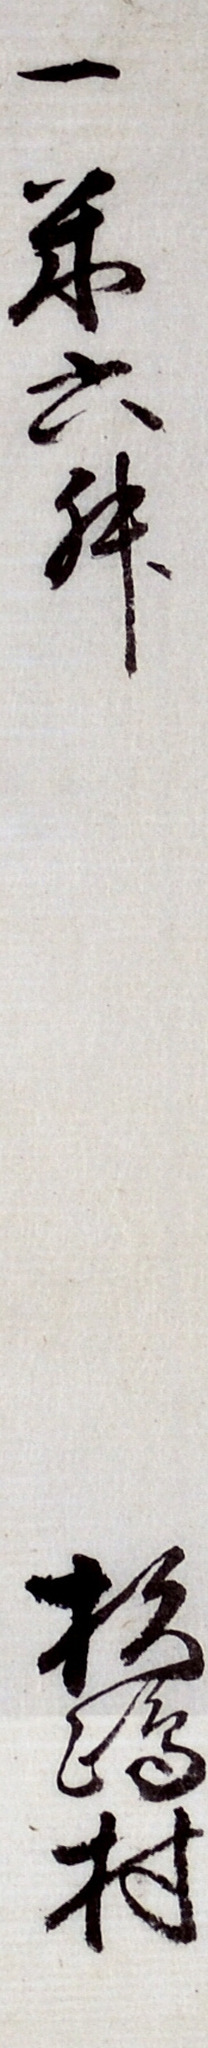一米六升杉嶋村
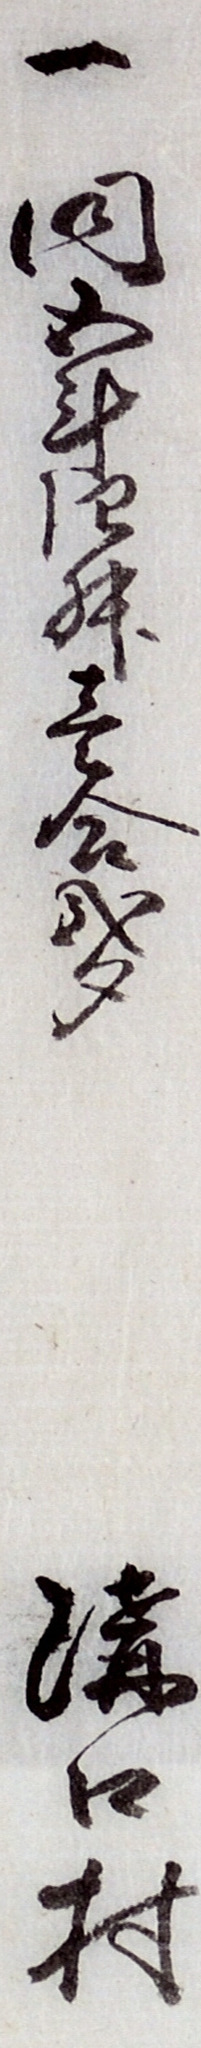一同五斗四升壱合弐勺溝口村
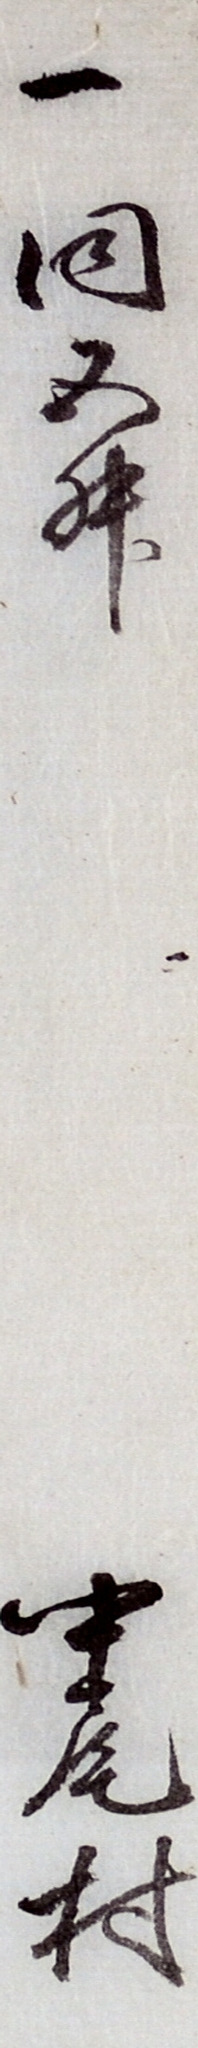一同五升中尾村
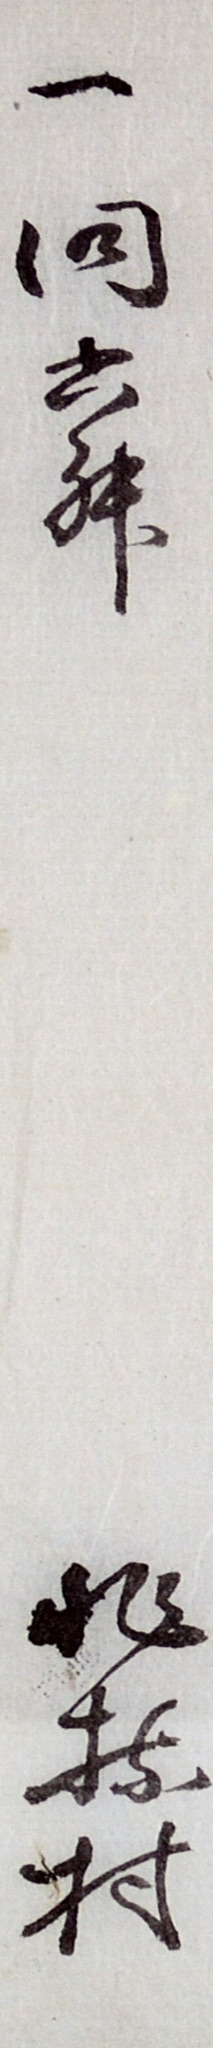一同六升非持村
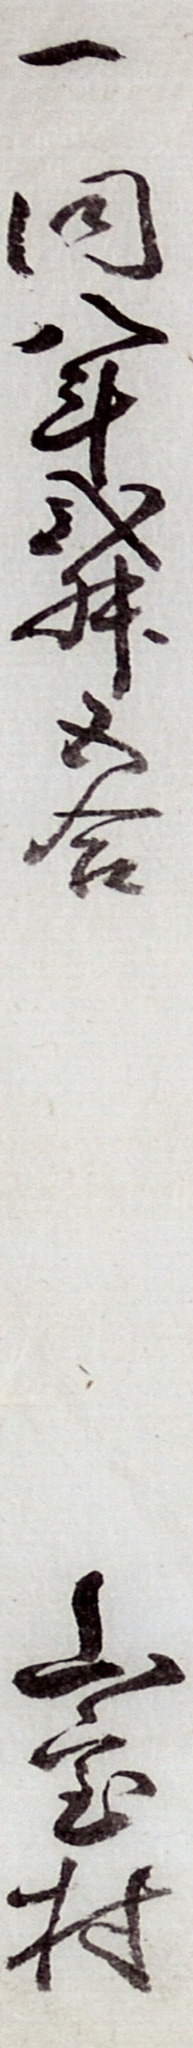一同八斗弐升五合山室村

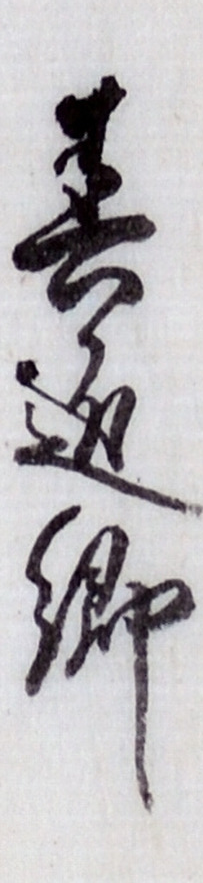春近郷
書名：官林下草御山代取立帳
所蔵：伊那市立高遠町図書館・合同会社AMANE
